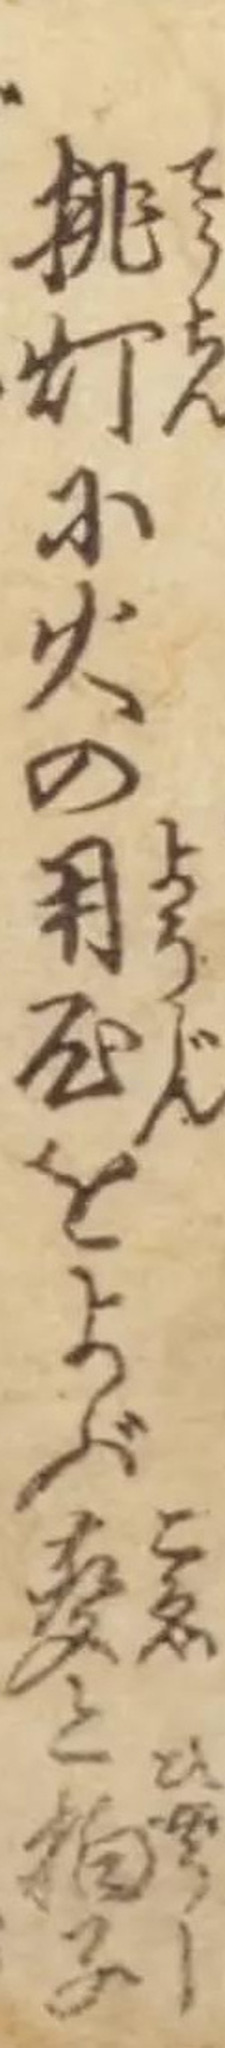挑灯に火の用心をよぶ聲と拍子
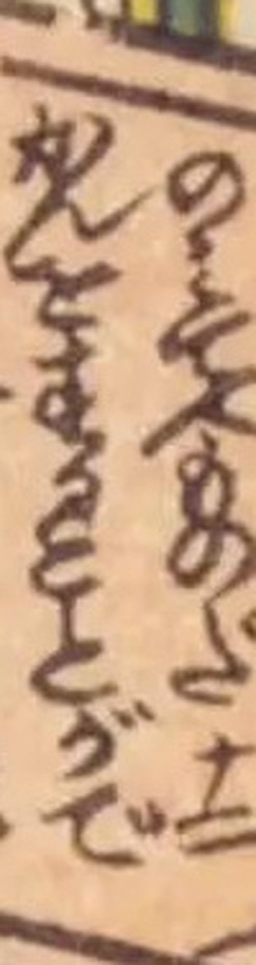かんをすることがで
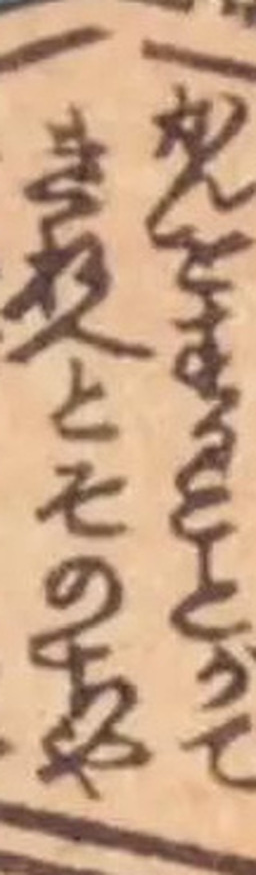きねへとそのちや
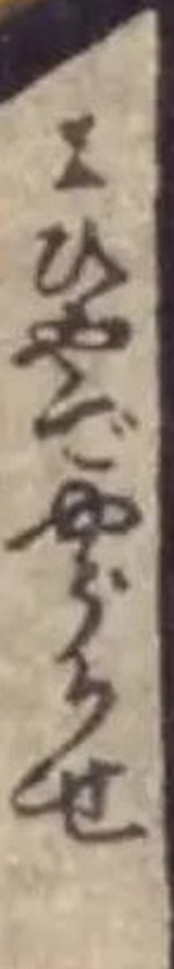▼▲ひやでやらうせ
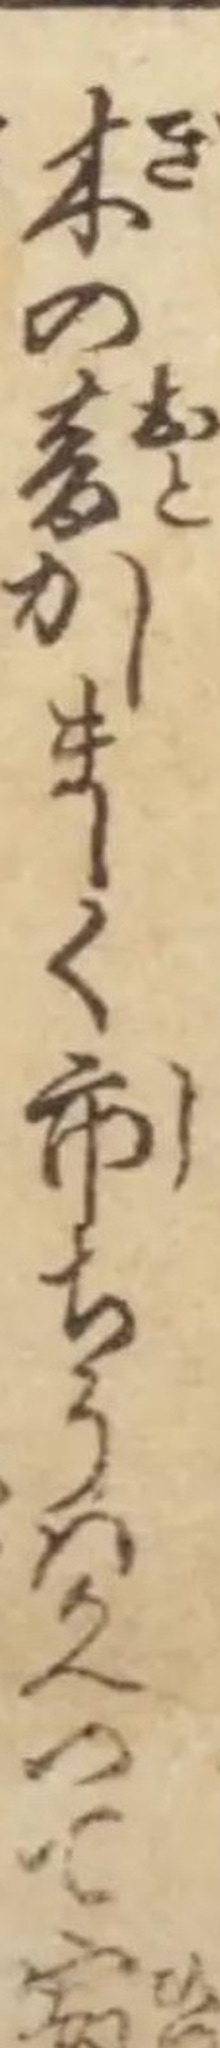木の音かしましく市ちうはかへつて寂
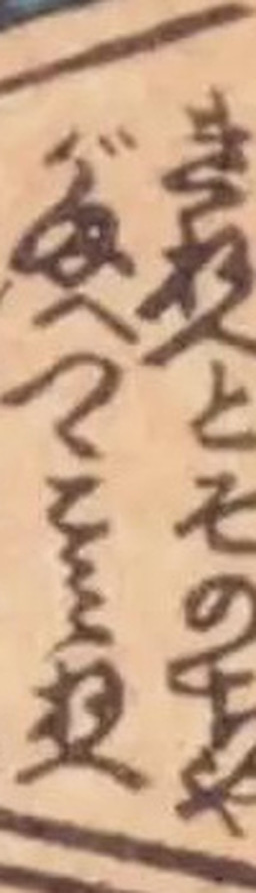がまへつゝこみねへ
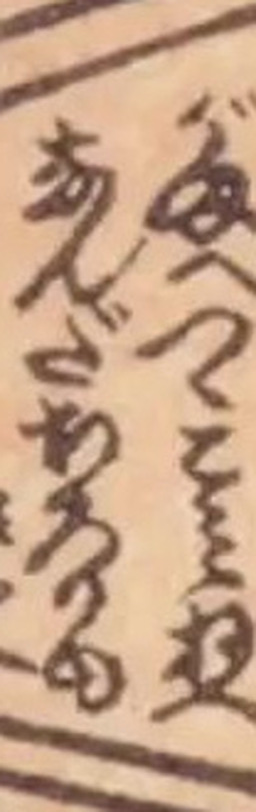なんだちろりも
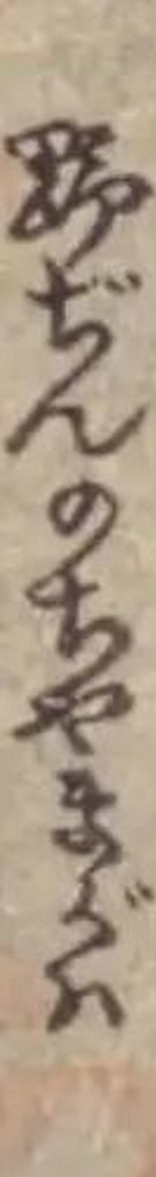野ぢんのちやまがは
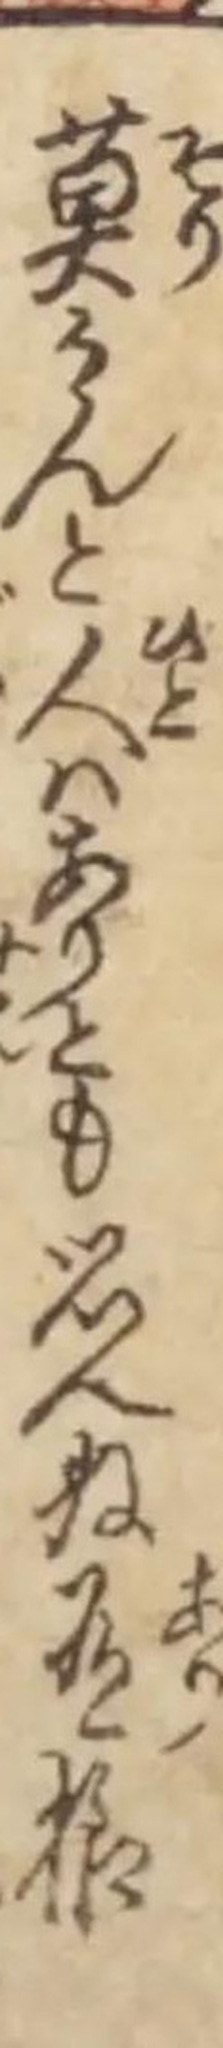莫かんと人はありとも思へぬ有様
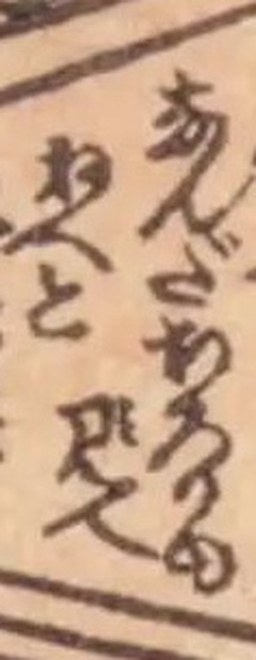ねへと
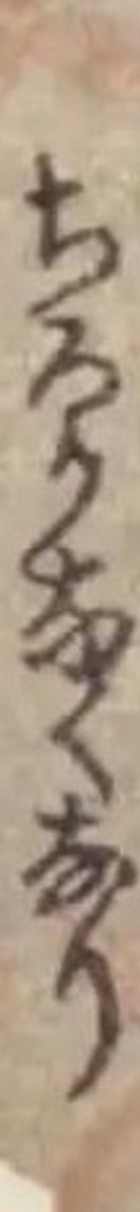ちろりなくなり
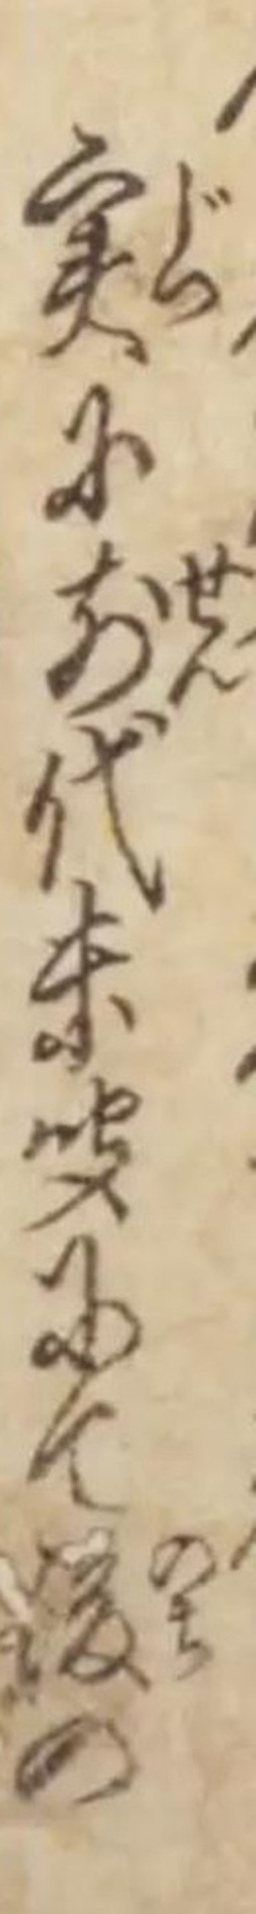実に前代未聞にて後の
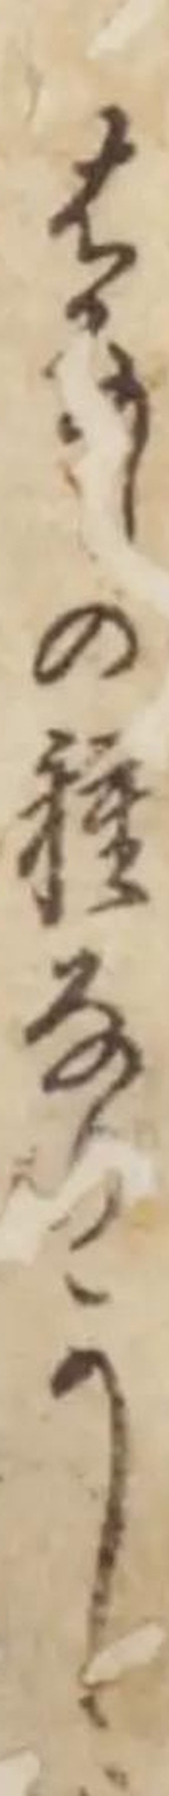はなしの種なりかし
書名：地震後野宿の図
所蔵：国立国会図書館 National Diet Library, JAPAN
